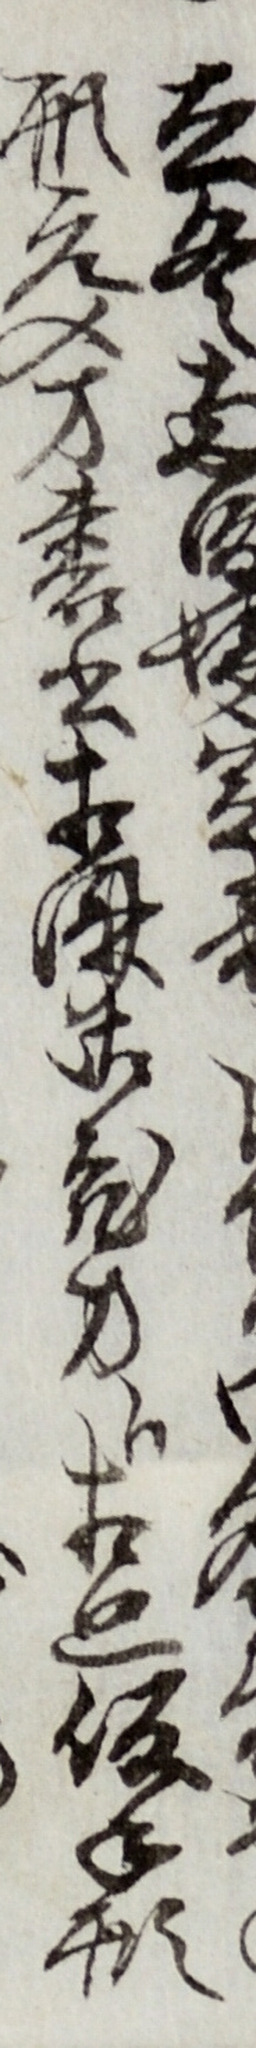形元〆方裏書相済御蔵方江相廻仮手形
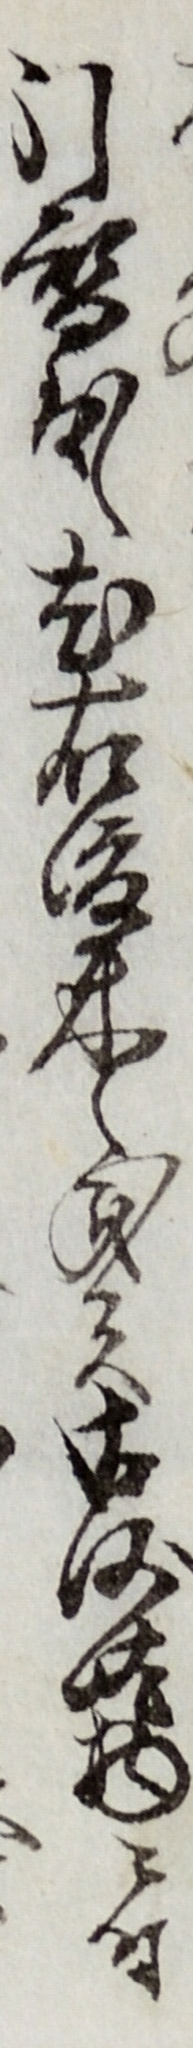引替致候尤右渡米之義者御沙汰物ニ付
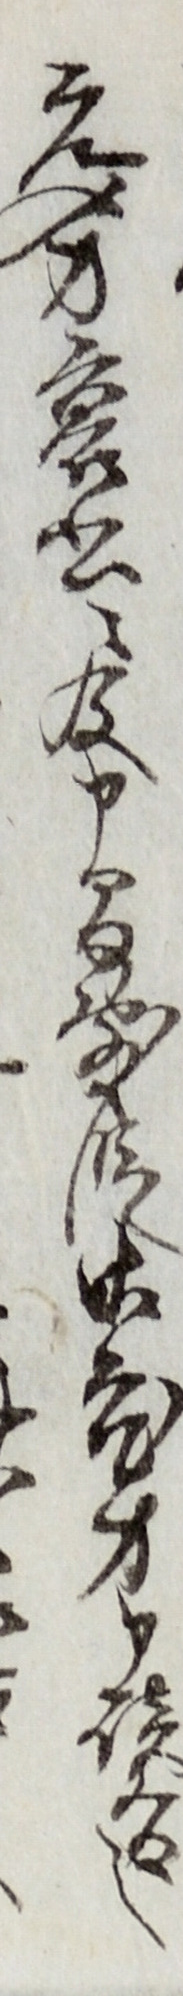元〆方裏書ニ及申間敷候段御蔵方申談有之
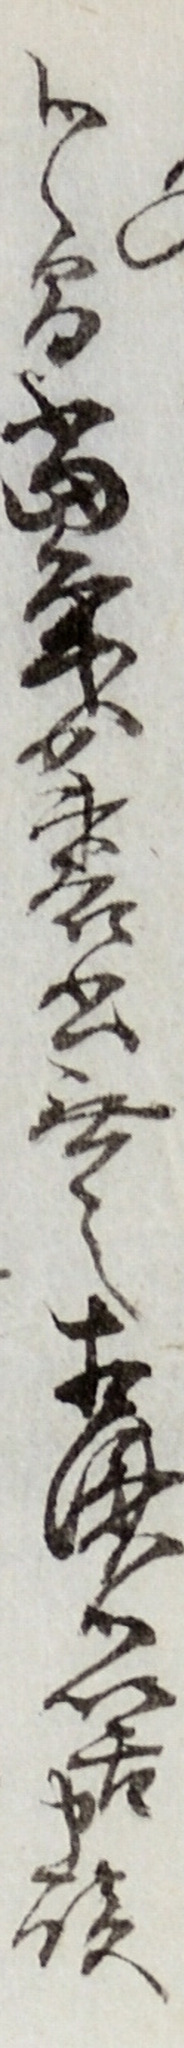候間当年ゟ裏書無之相済候筈申談
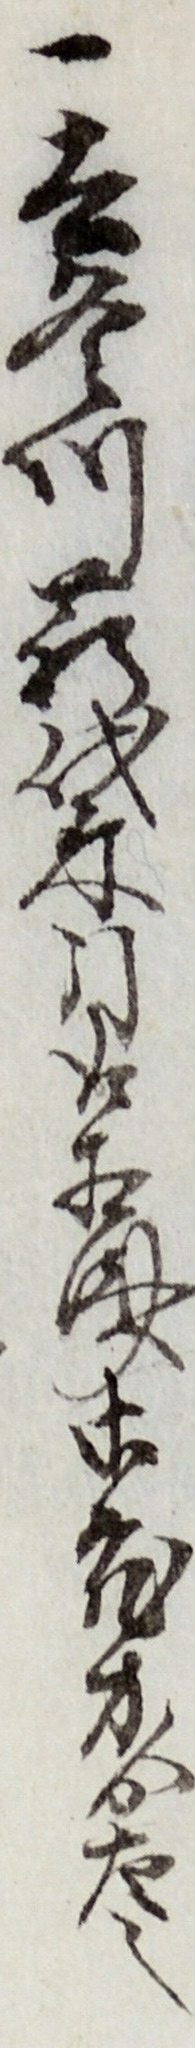一去冬川薪伐木引取相済御蔵方ゟ左之
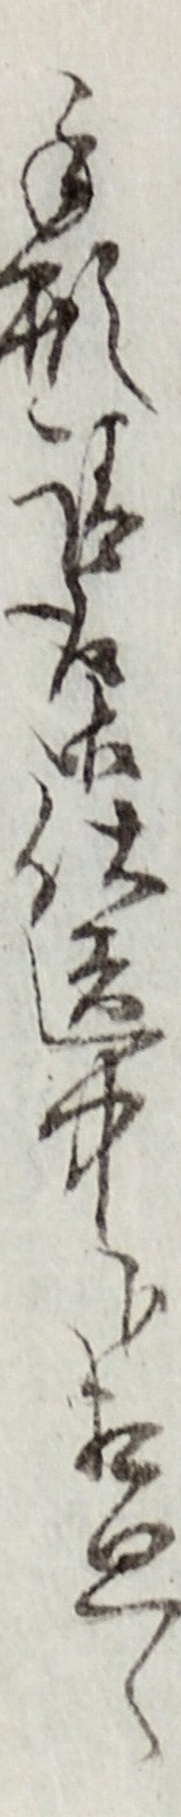手形請取御仕送中江相廻候
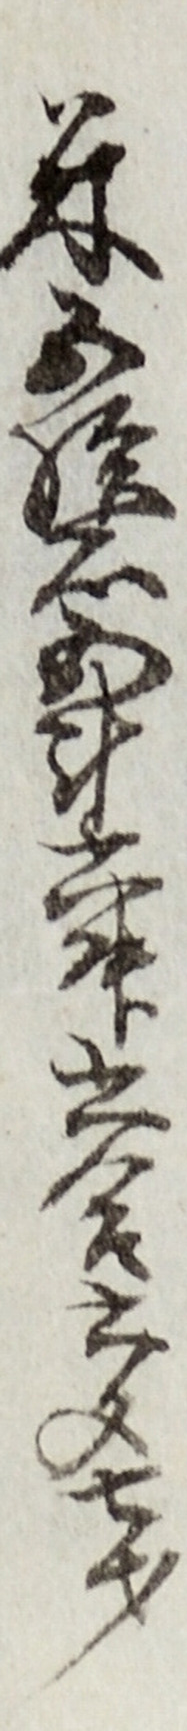米五拾石斗六升六合六匁七才
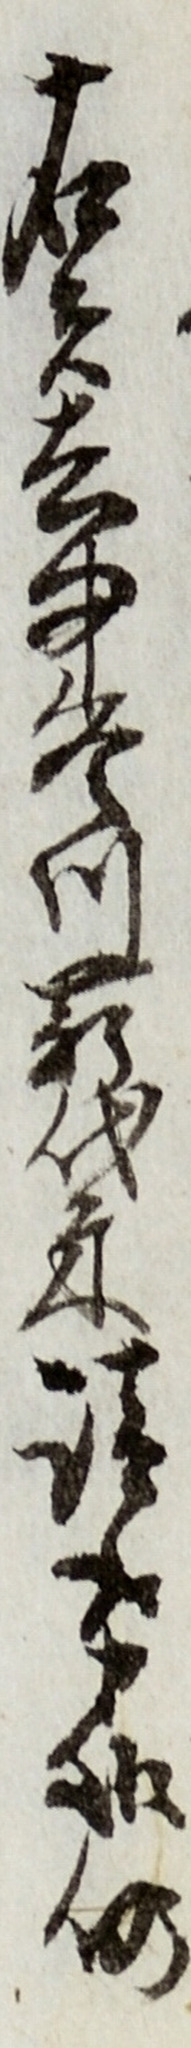右者去申冬川薪伐木請取申処仍
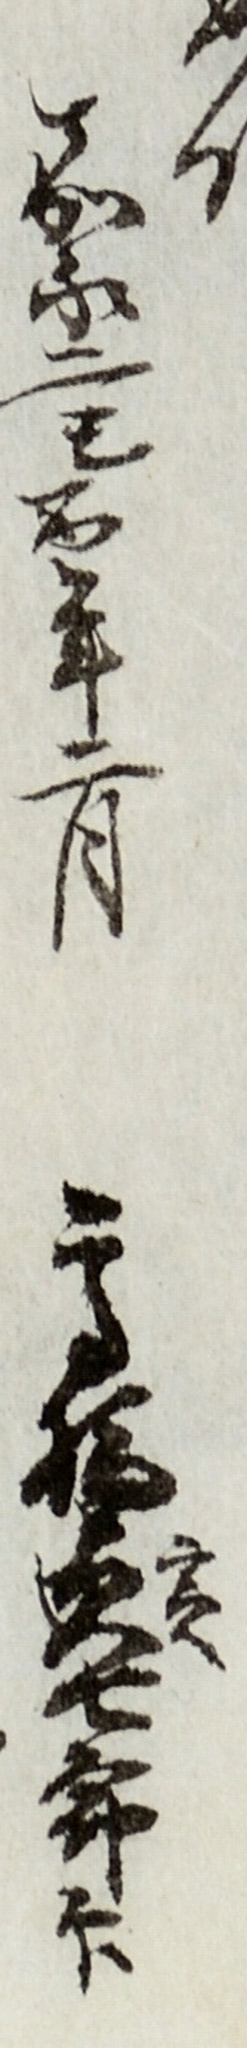嘉永二巳酉年二月高橋寅七郎印
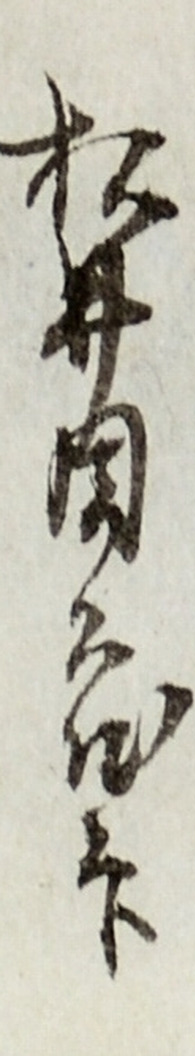松井周蔵印
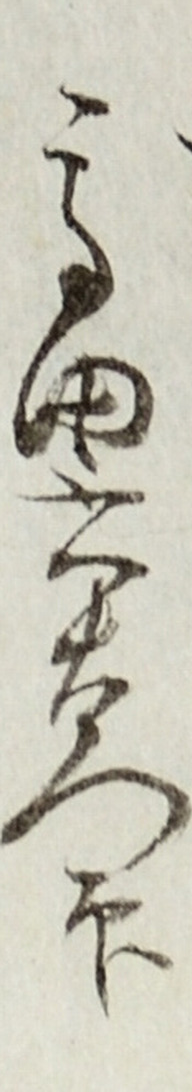高田六右衛門印
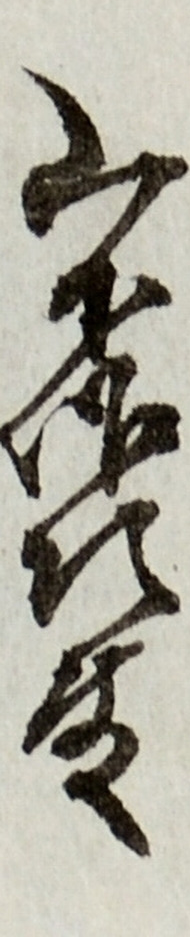山下作次殿
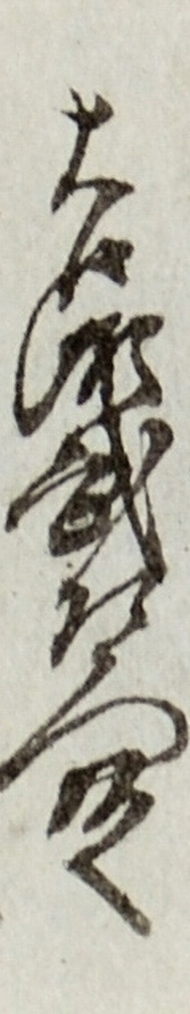吉瀬武左衛門殿
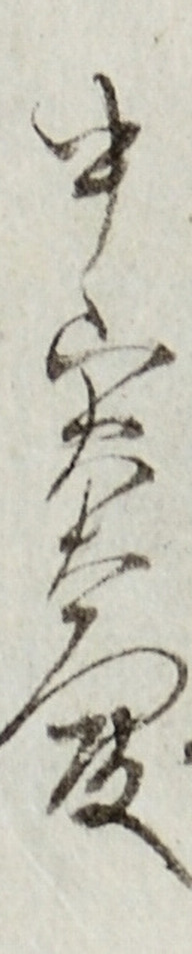中山忠右衛門殿
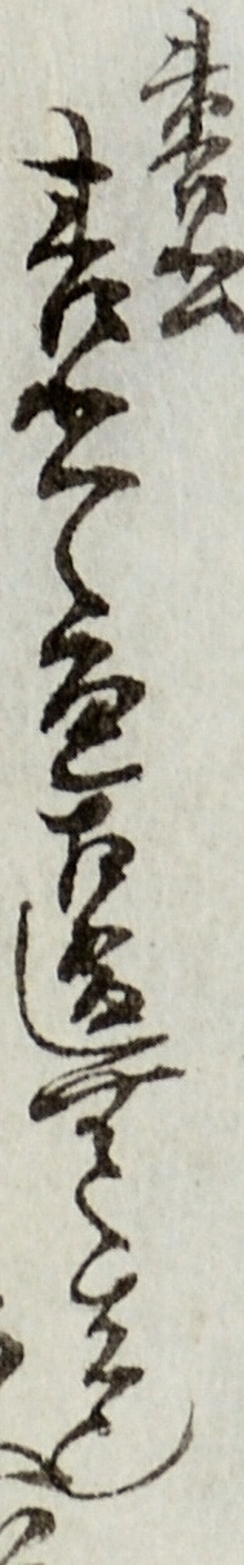表書之通相違無之者也
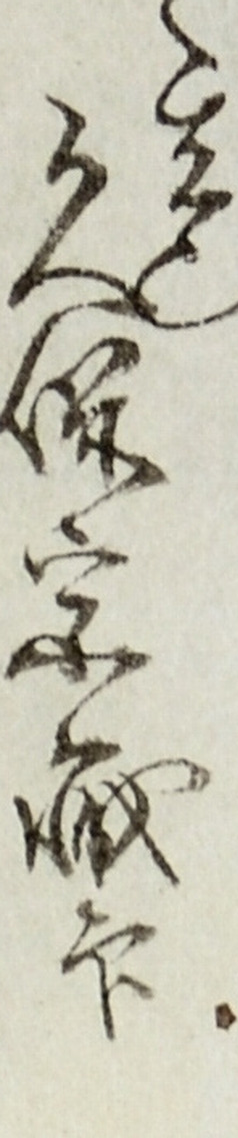久保宗蔵印
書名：御山方御薪方諸事御用留
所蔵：伊那市立高遠町図書館・合同会社AMANE
